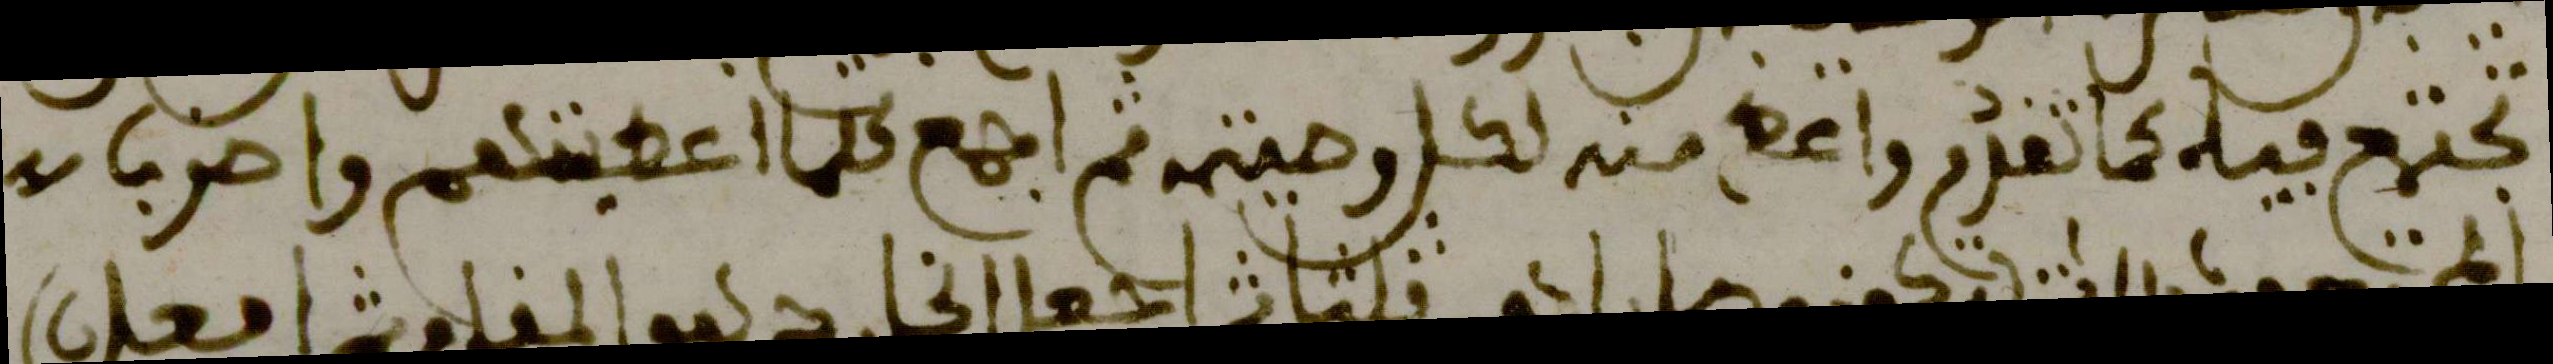تجتمع فيه كما تقدم واعط منه لكل وصيته ثم اجمع كلما اعطيتهم واضرب
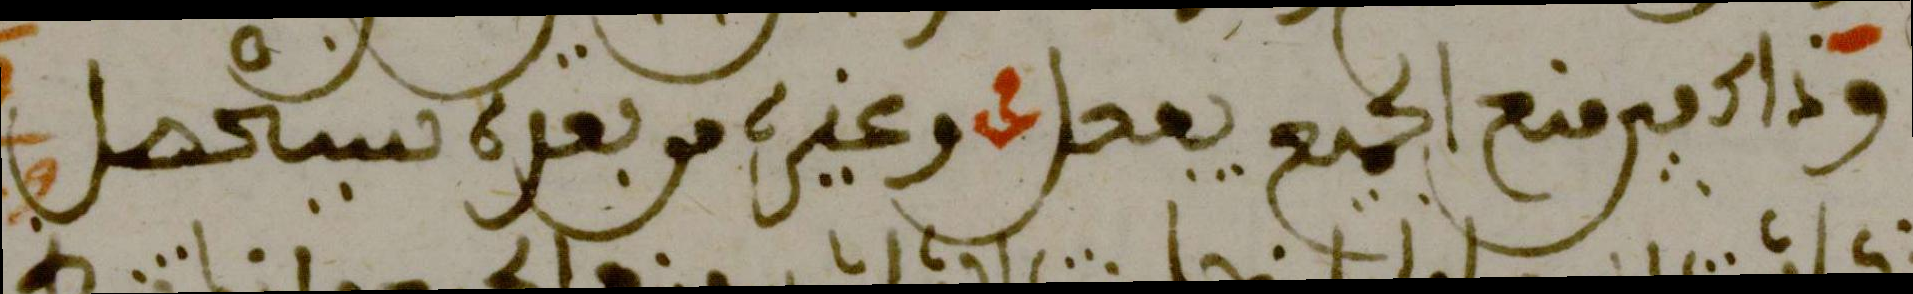وَذاك في منع الجميع يفعل وغيره من بعده سيحْصل
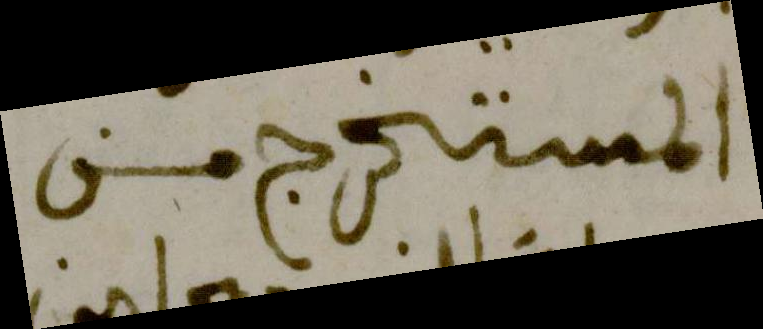المستخرج من
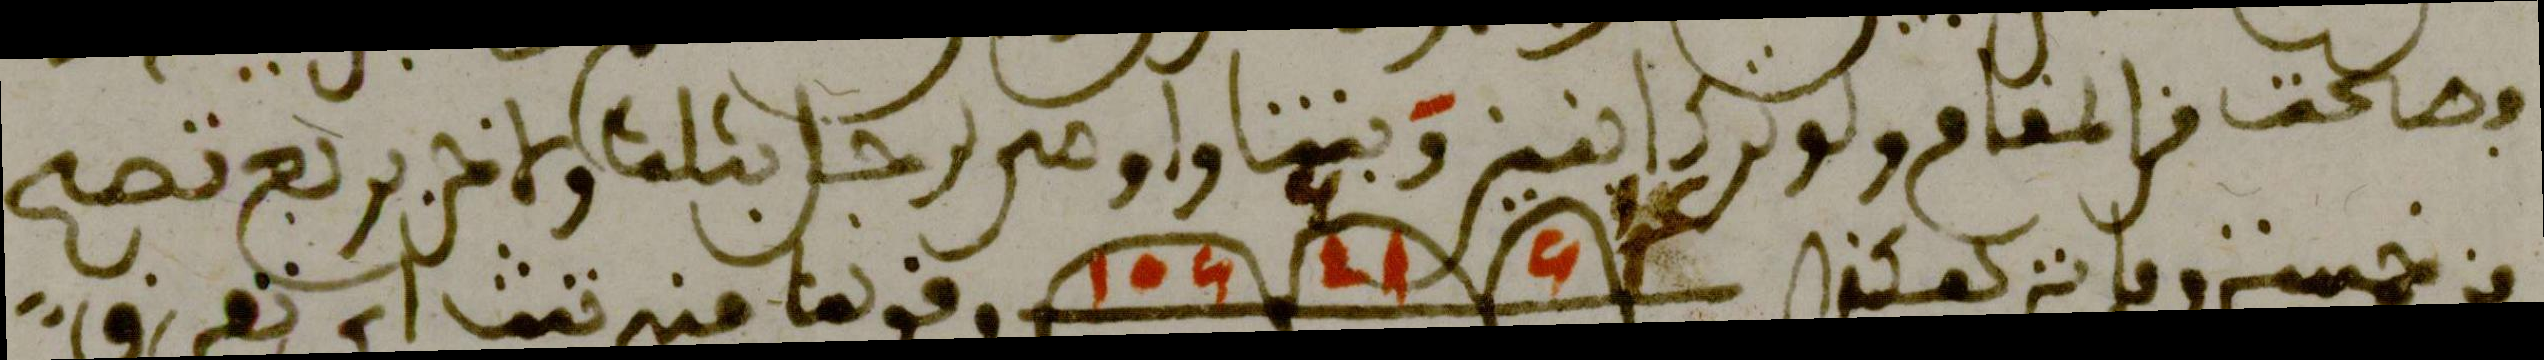فصحت من المقام ولو ترك ابنين وَبنتا واوصى لرجل بثلث ولاخر بربع تصح
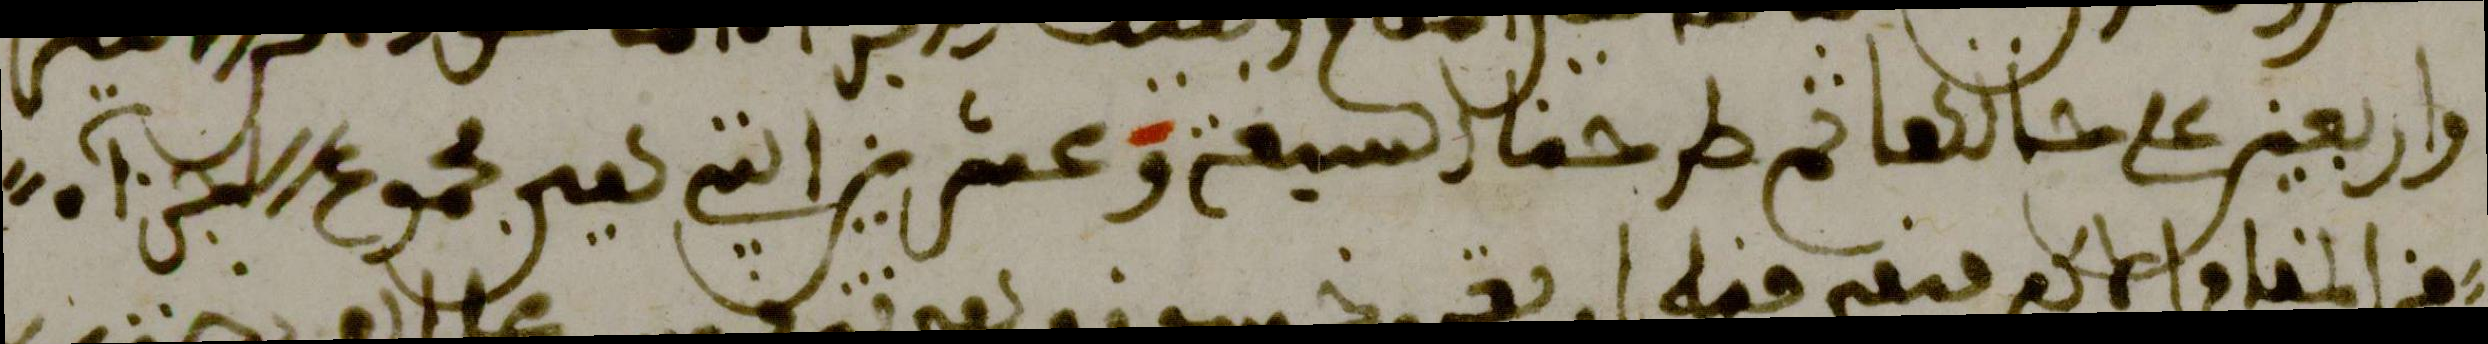واربعين على حالها ثم طرحنا السبعة وَعشرين التي هي مجموع الاجزاء
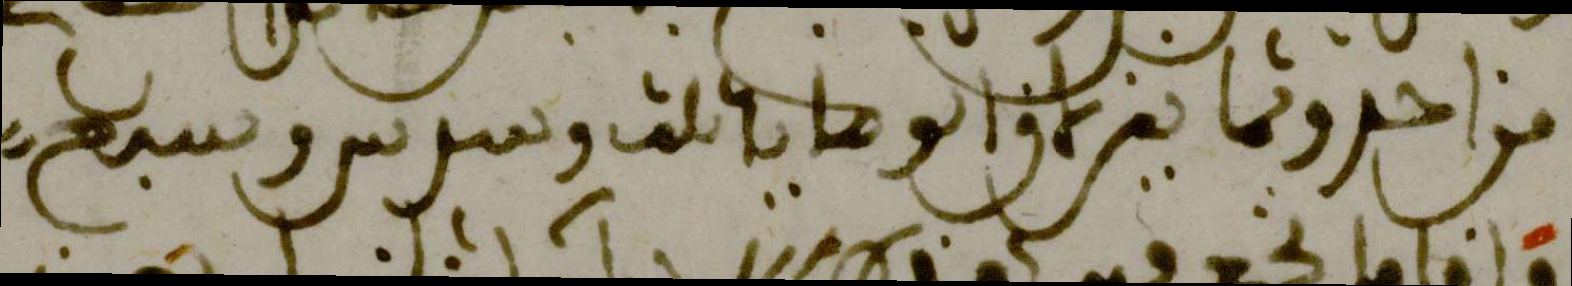من احد وثمانين لان الوصايا ثلث وسدس وسبع
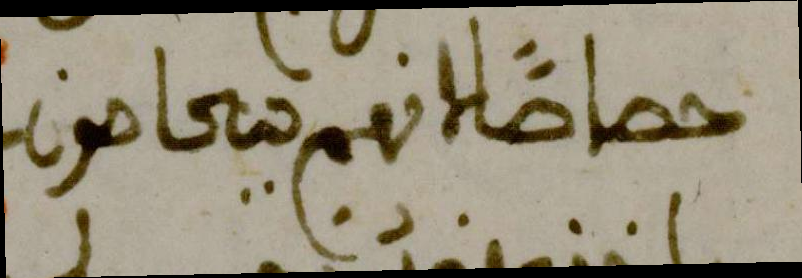حصاصًا لانهم يتحاصون
